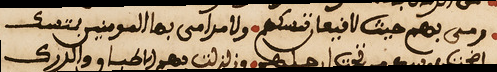رمن بهم حيث لا قيعان تمسكهم ولامرامى بها المومنين ممتسك
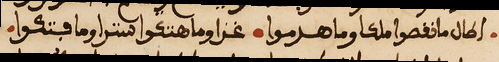اطال ما نقصوا ملكا وما هدموا غزا وما هتكوا سترا وما فتكوا
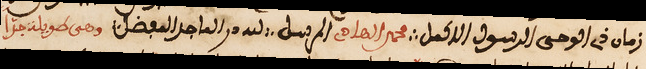زمان ذي الوحى الرسول الاكمل محمد الهادى المرسل لله در الماجد المفضل وهى طويلة جدا
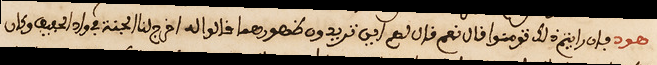هود فان رايتم ذلك تومنوا قال نعم قال لهم اين تريدون ظهورهما قالوا له اخرج لنا الجنة في واد الحقيق وكان
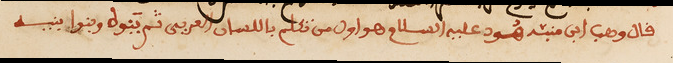قال وهب ابن منبه هود عليه السلام هو اول من تكلم بالسان العربي ثم بنوه وبنوا بنيه
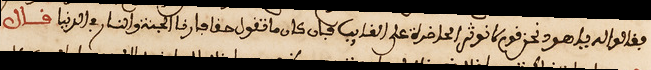فقالوا له يا هود نحن قوم لا نوثر الحاضرة على الغائب فان كان ما تقول حقا فارنا الجنة والنار في الدنيا قال
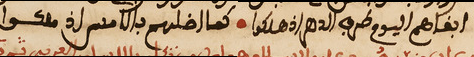ابقاهم اليوم طرف الدهر اذ هلكوا كما اضلهم بالامس اذ ملكوا
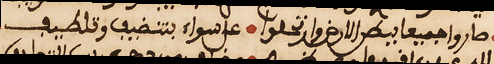صار واجميعا ببطن الارض وارتحلوا على سواء بتنضيف وتلطيف
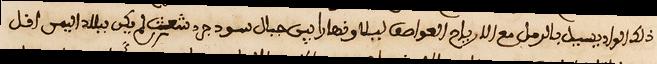ذلك الواد يسيل بالرمل مع الارياح العواصف ليلا ونهارا بين جبال سود جرد شعث لم يكن ببلاد اليمن اقل
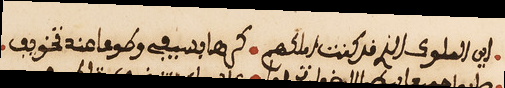اين الملوك الذي قد كنت املكهم كوها بسيفي وطوعا عند تخويف
